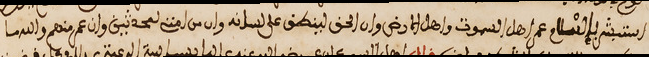استبشر بإلسْلام عمر اهل السموت واهل الارض وان الحق لينطق على لسانه وان من امتى لمحدثين وان عمر منهم والله ما
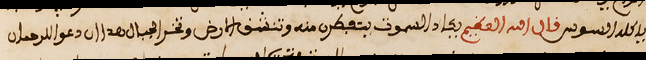ياكله السوس قال الله العظيم يكاد السموت يتفطرن منه وتنشق الارض وتخر الجبال هذا ان دعوا للرحمان
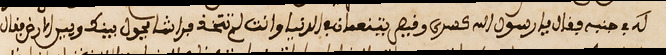له في جنبه فقال يا رسول الله كسرى وقيصر يتنعمان الدنيا وانت لم تتخذ فراشا يحول بينك وبين الارض فقال
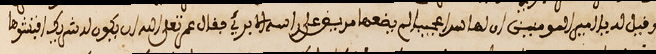وقيل له يا امير المومنين ان لها سرا عجيبا لم يضعها مريض على راسه الا برئ فقال عمر تعلى الله ان يكون له شريك افتشوها
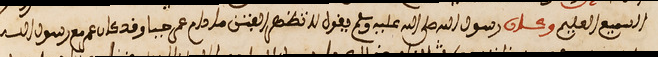السميع العليم وكان رسول الله صلى الله عليه وسلم يقول لا تظهر الفتن ما دام عمر حيا وقد كان عمر مع رسول الله
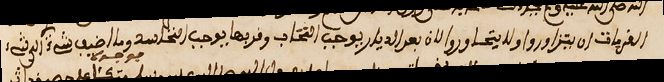الغرابات ان يتزاوروا ولا يتجاوروا لان بعد الديار يوجب المحاب وقربها يوجب التحاسد ما اضيف شىء الى شىء
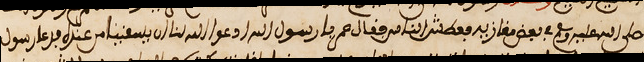صلى الله عليه وسلم في بعض مغازيه فعطش الناس فقال عمر يا رسول الله ادعوا الله لنا ان يسقينا من عنده فدعا رسول
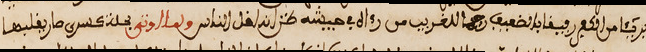بريئا من الكفر رفيقا بالضعيف رحيما للغريب من رءاه في جيشه ظن انه اقل الناس ولما اوتى بحلة كسرى صار يقلبها
